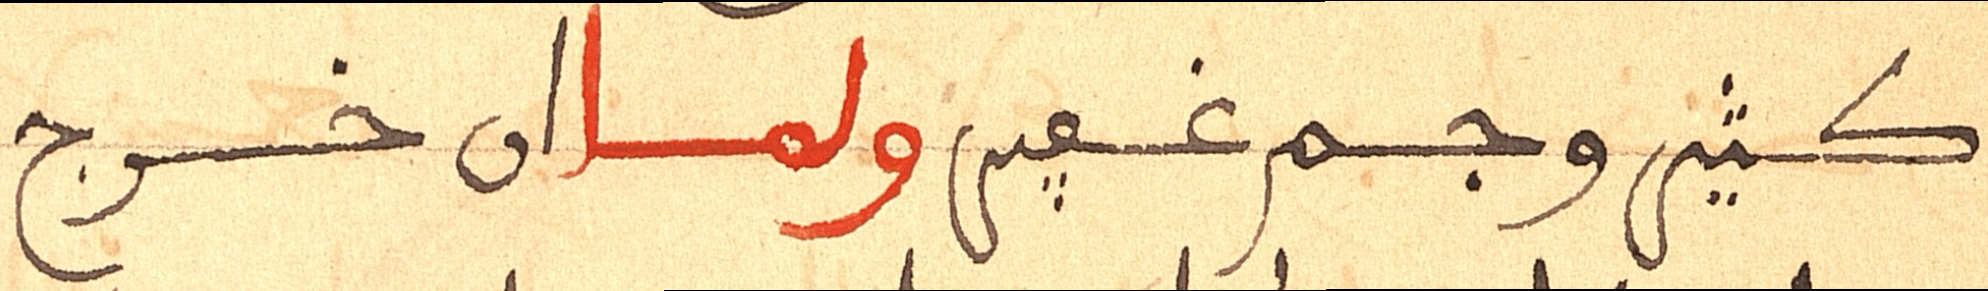كثير وجم غفير ولما ان خرج
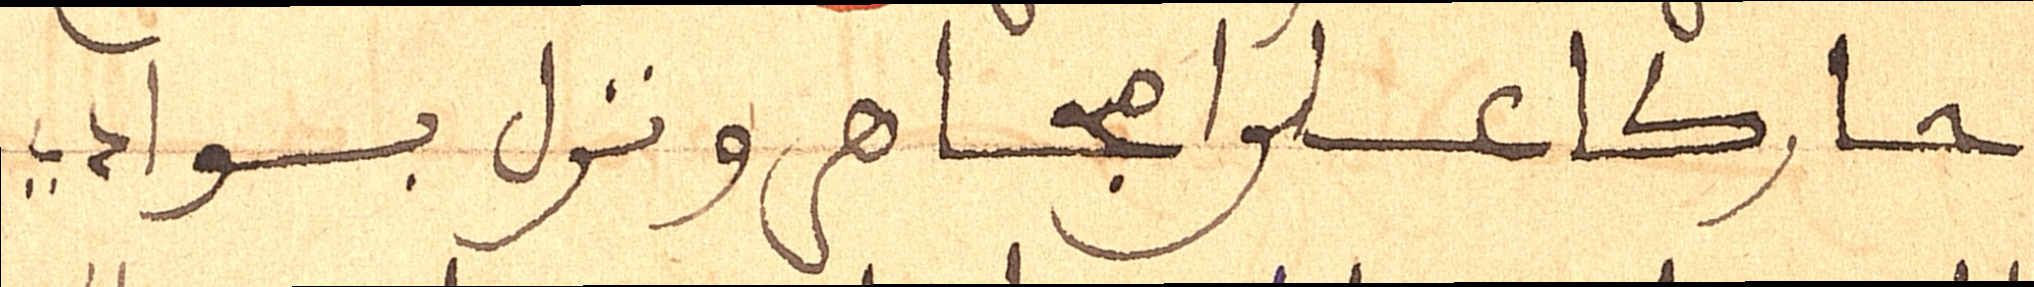حاركا على امجاهر ونزل بوادي
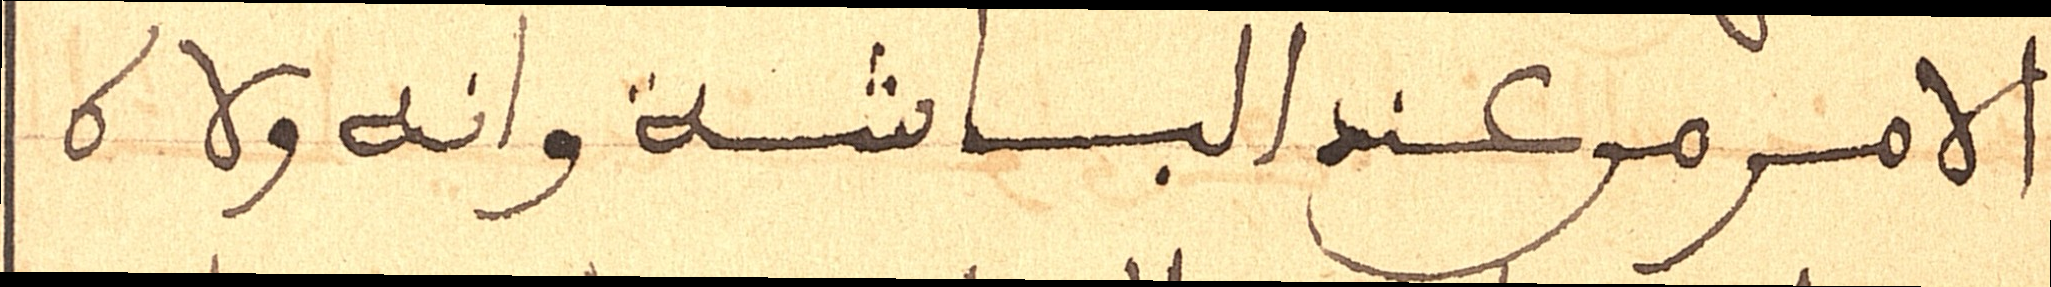الامر من عند الباشة وانه ولاه
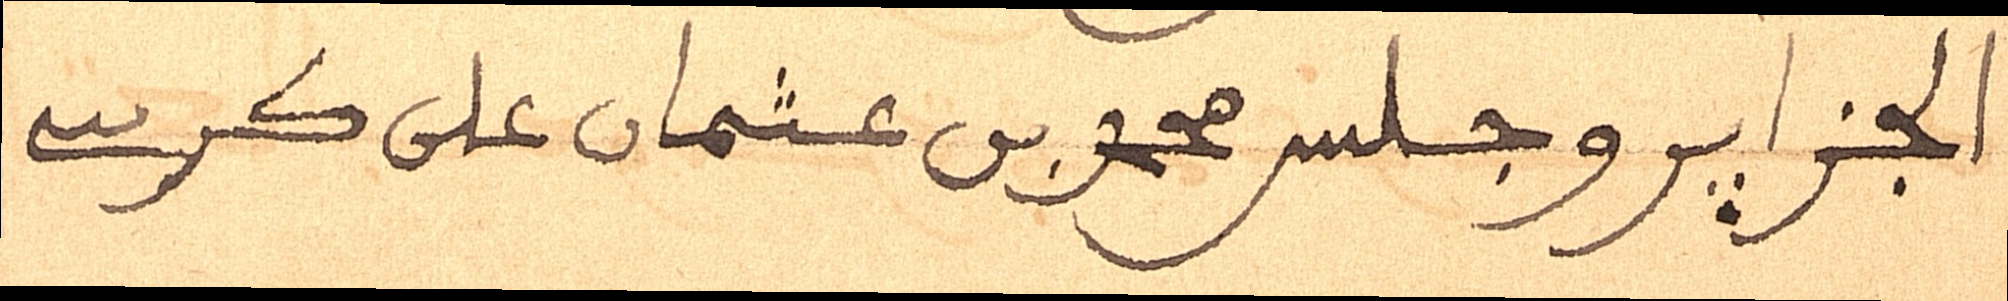الجزائر وجلس محمد بن عثمان على كرسى
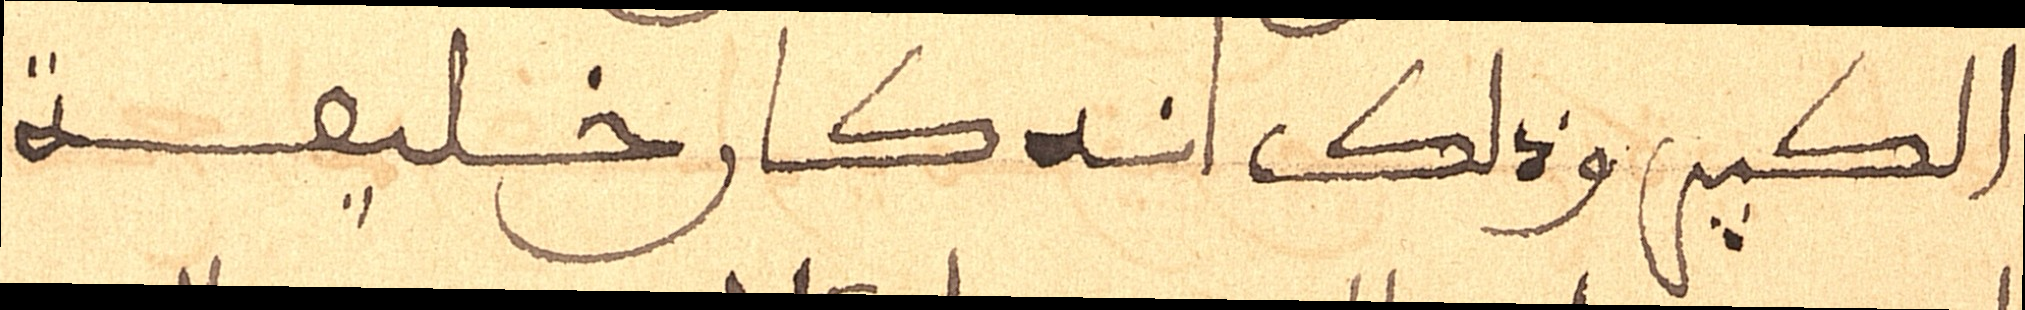الكبير ذلك انه كان خليفة
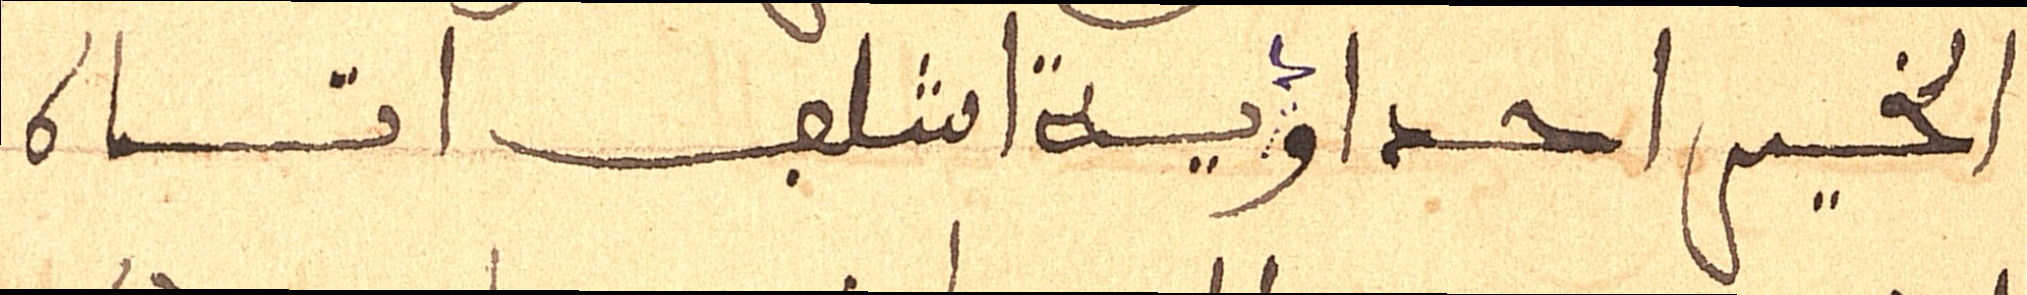الخير احد اوية اشلف اتاه
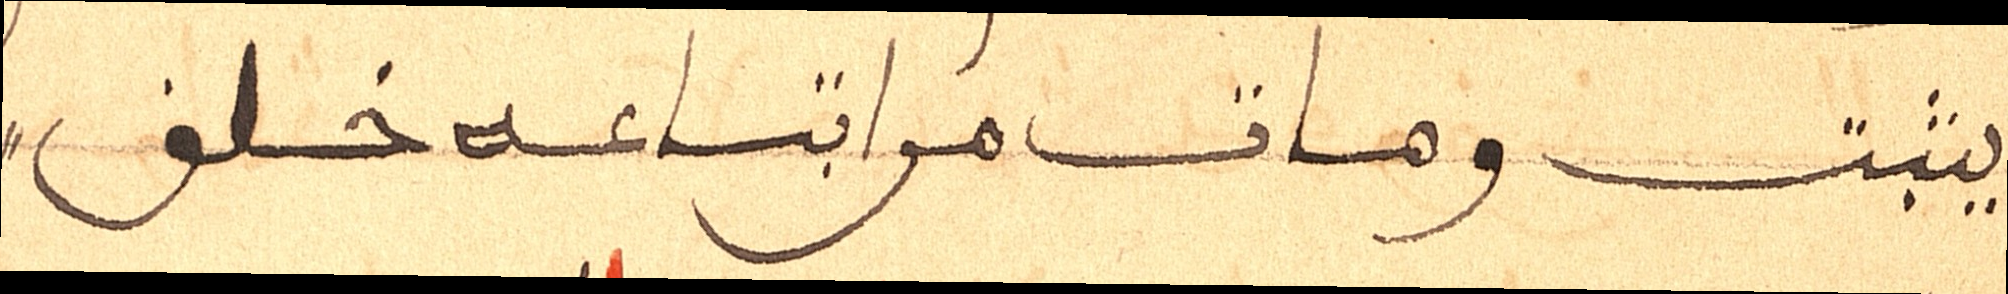يثبت ومات من اتباعه خلق
